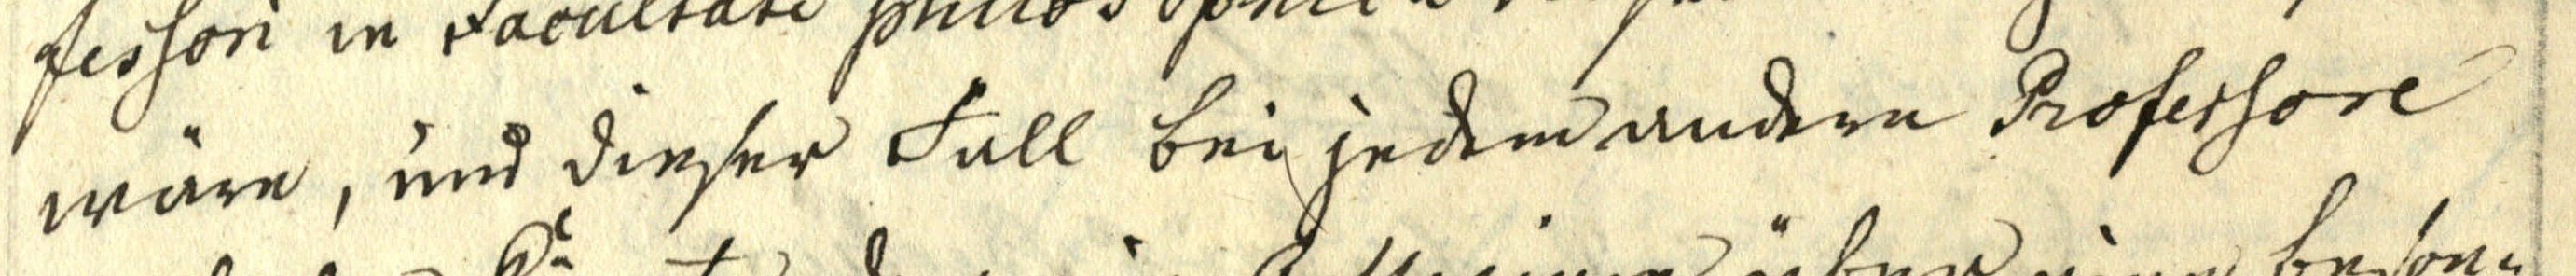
wäre, und dieser Fall bei jedem andern Professore
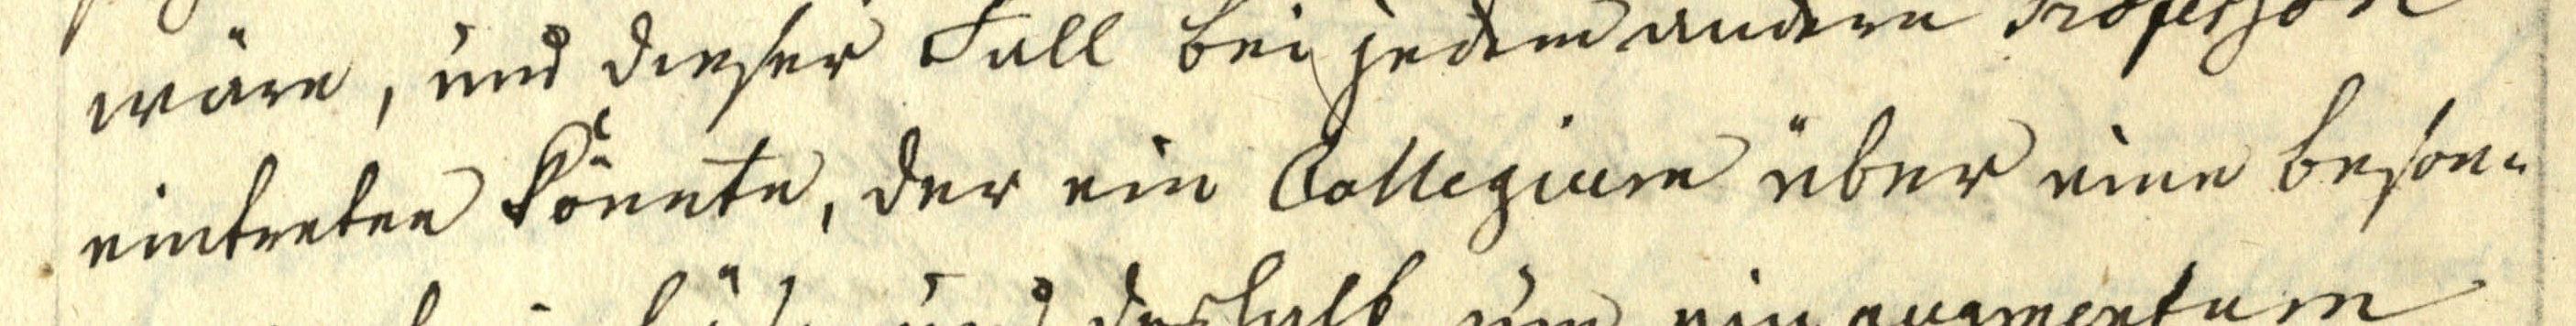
eintreten könnte, der ein Collegium über eine beson¬
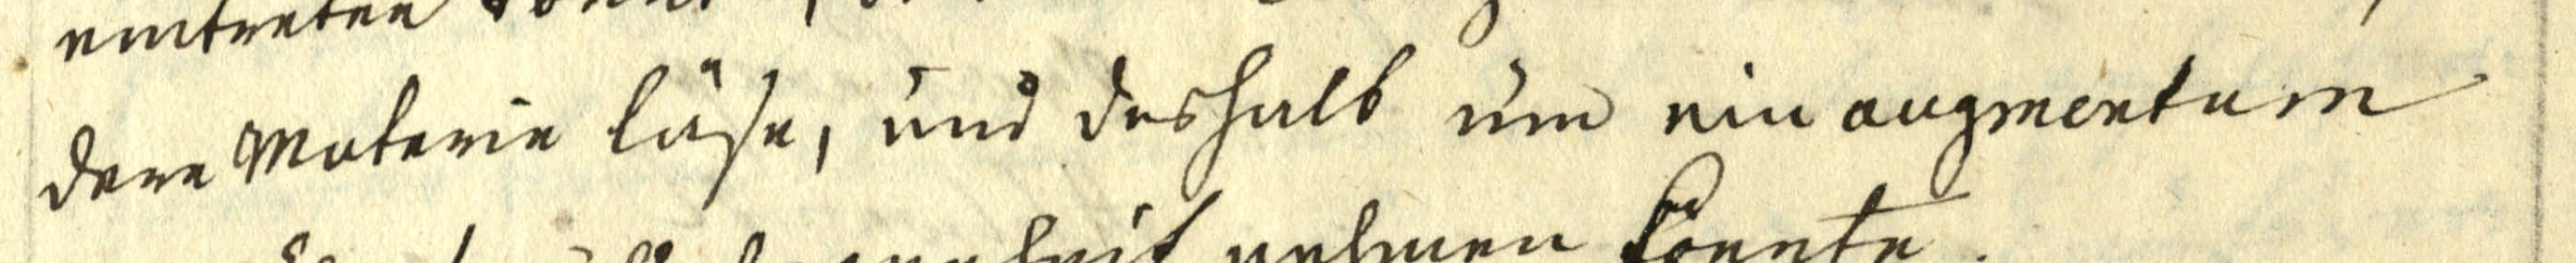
dere Materie läse, und deshalb um in augmentum
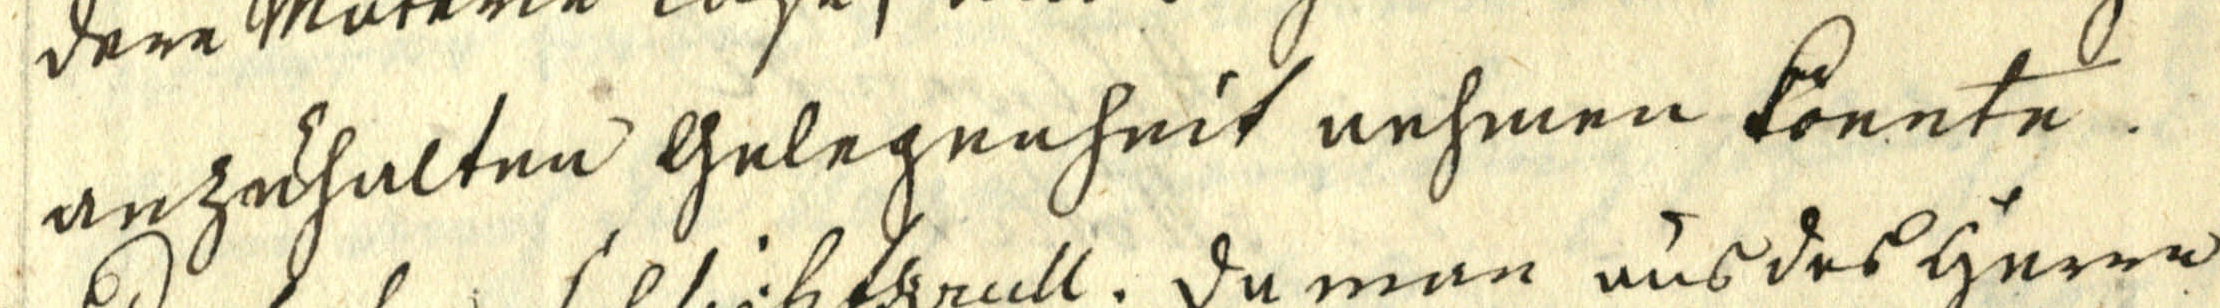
anzuhalten Gelegenheit nehmen könnte.
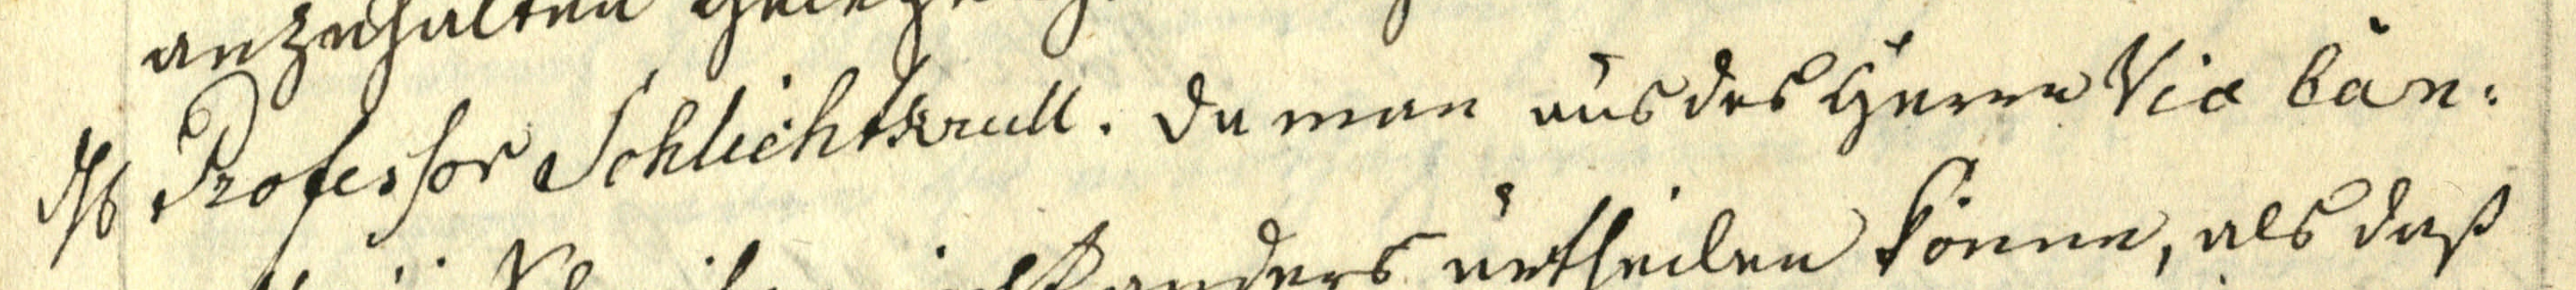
dh Professor Schlichtkrull. Da man aus des Herrn Vice Can¬
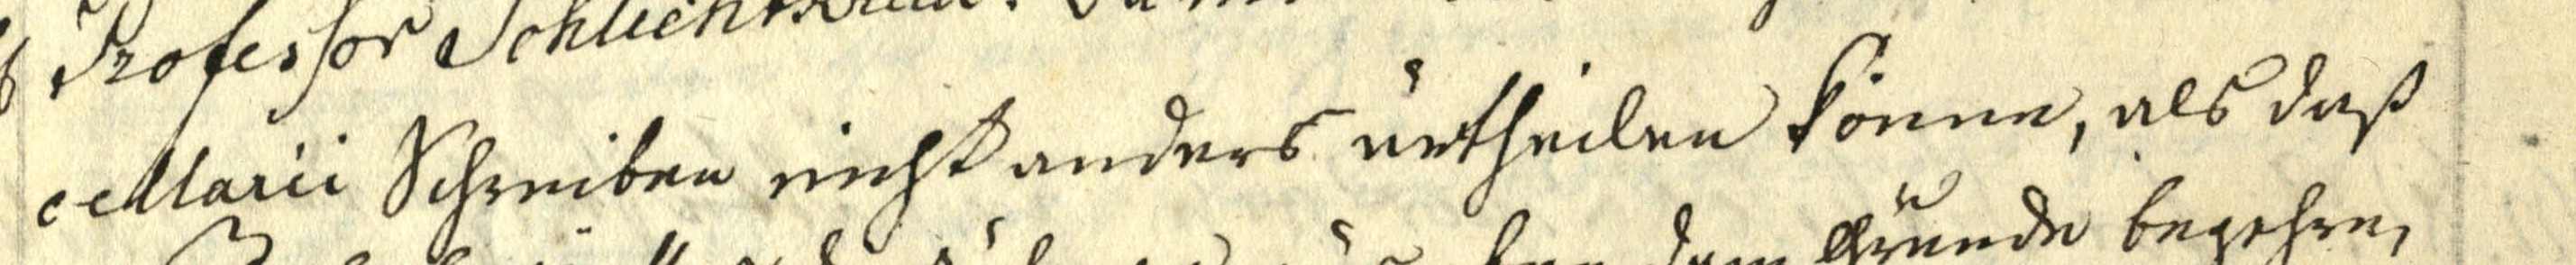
cellarii Schreiben nicht anders urtheilen könne, als daß
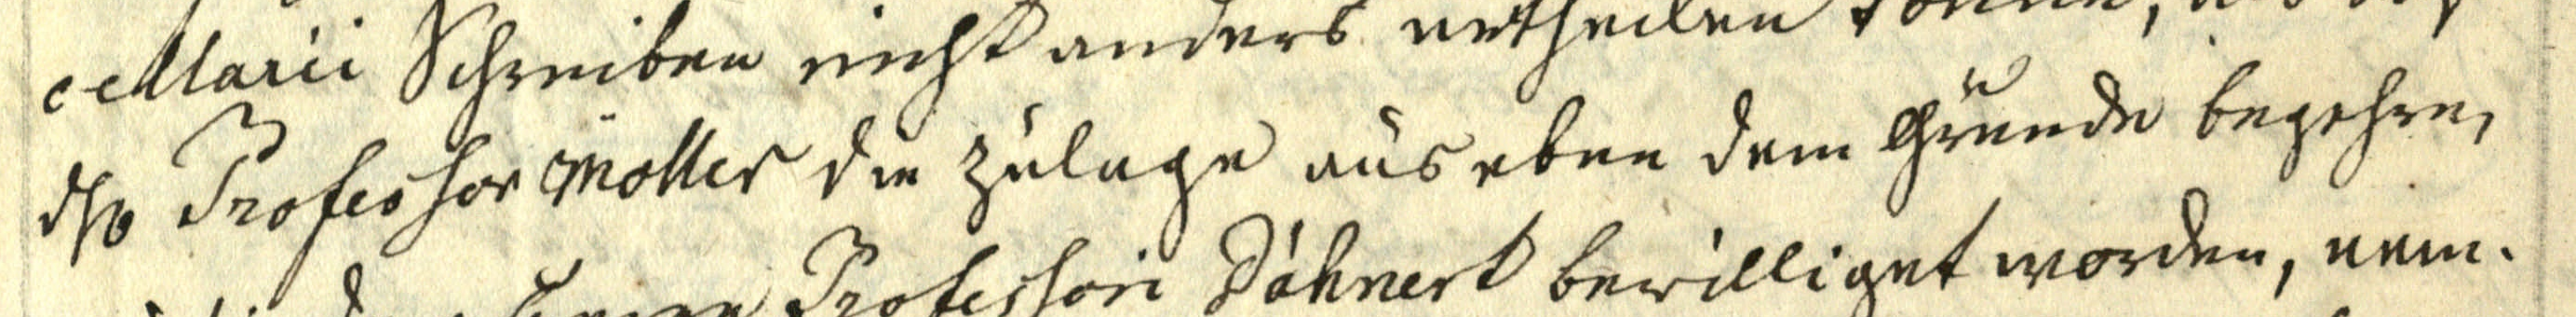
dh Professor Möller die Zulage aus eben dem Grunde begehre,
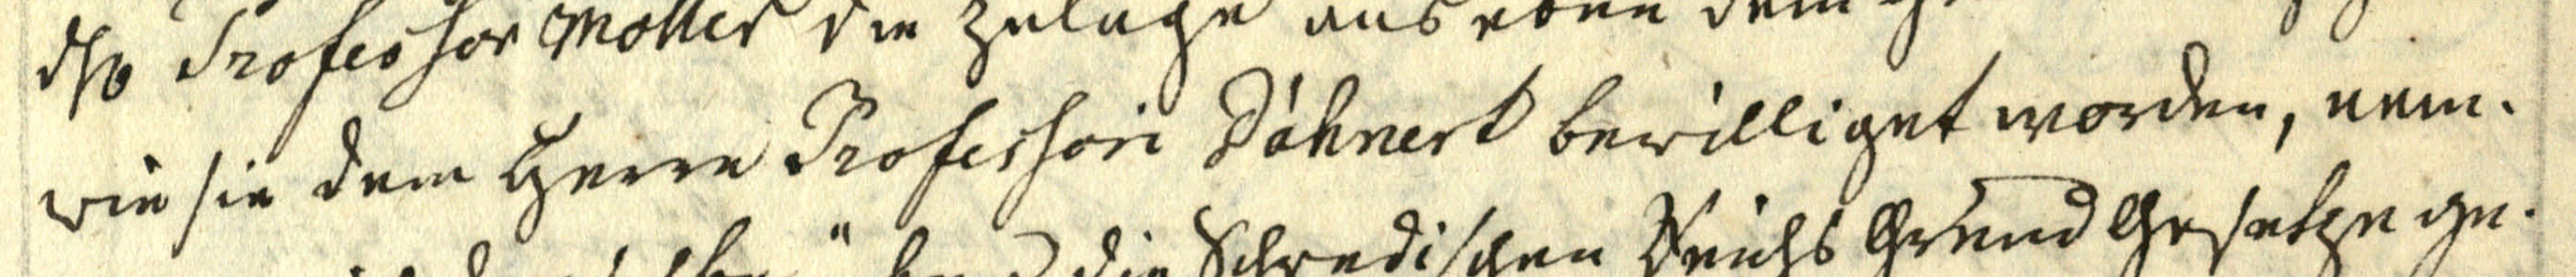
wie sie dem Herrn Professori Dähnert bewilliget worden, nem¬
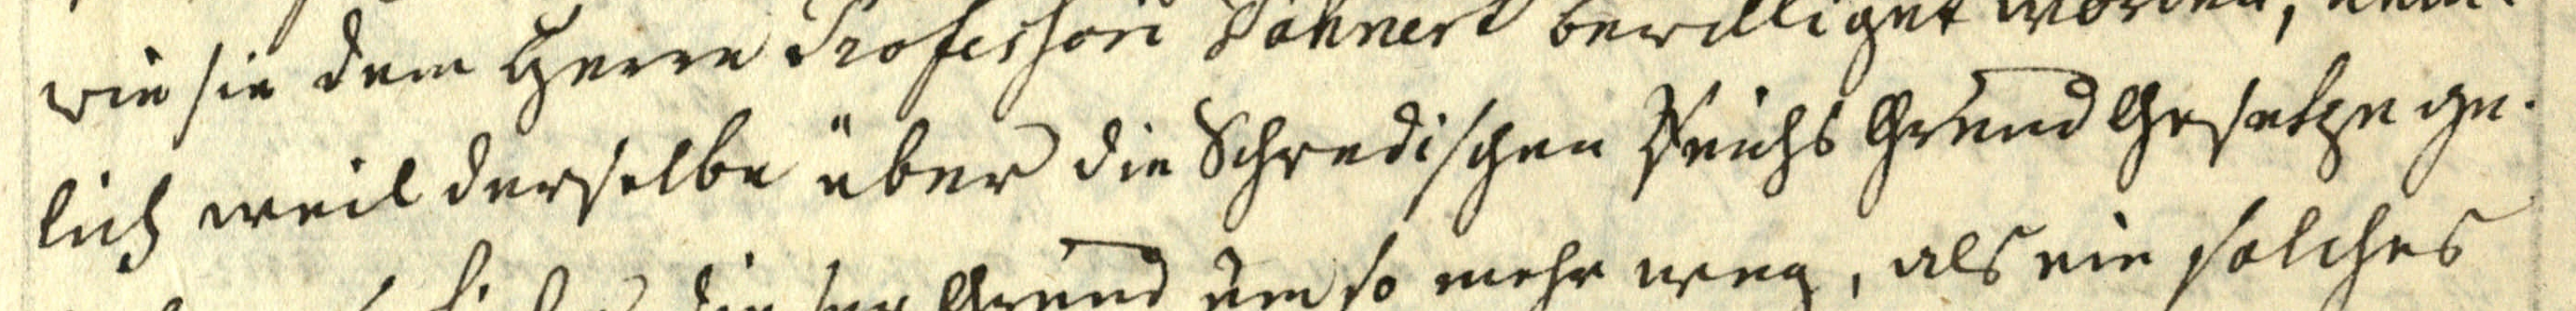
lich weil derselbe aber die Schwedischen Reichs Grund Gesetze ge¬
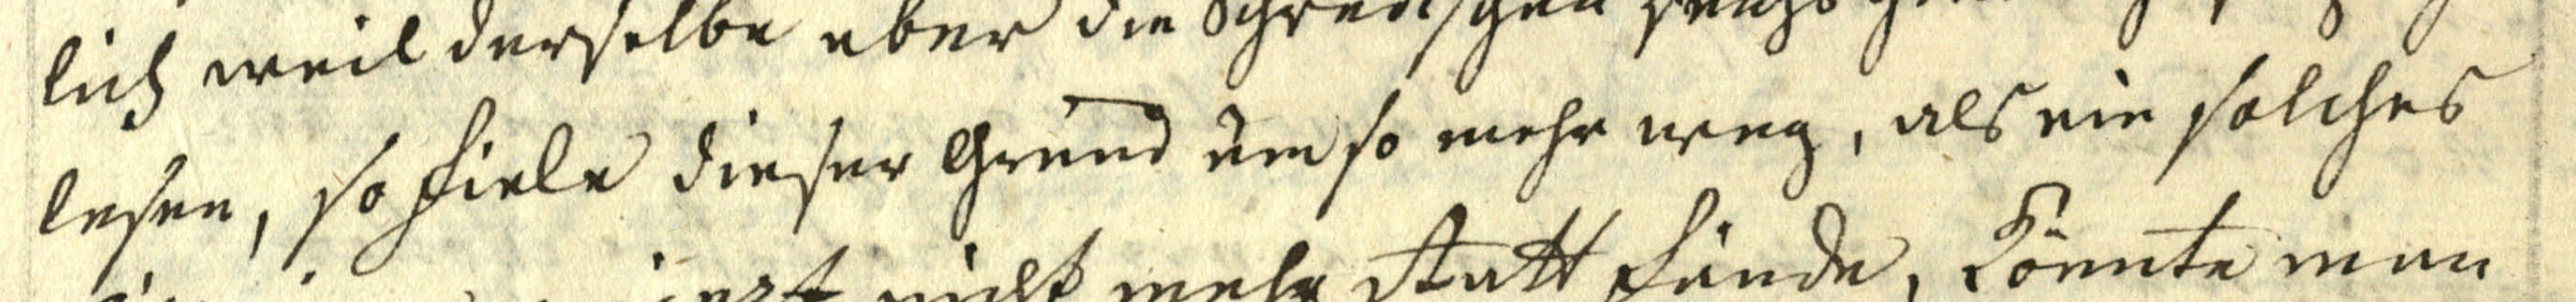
lesen, so fiele dieser Grund um so mehr weg, als ein solches
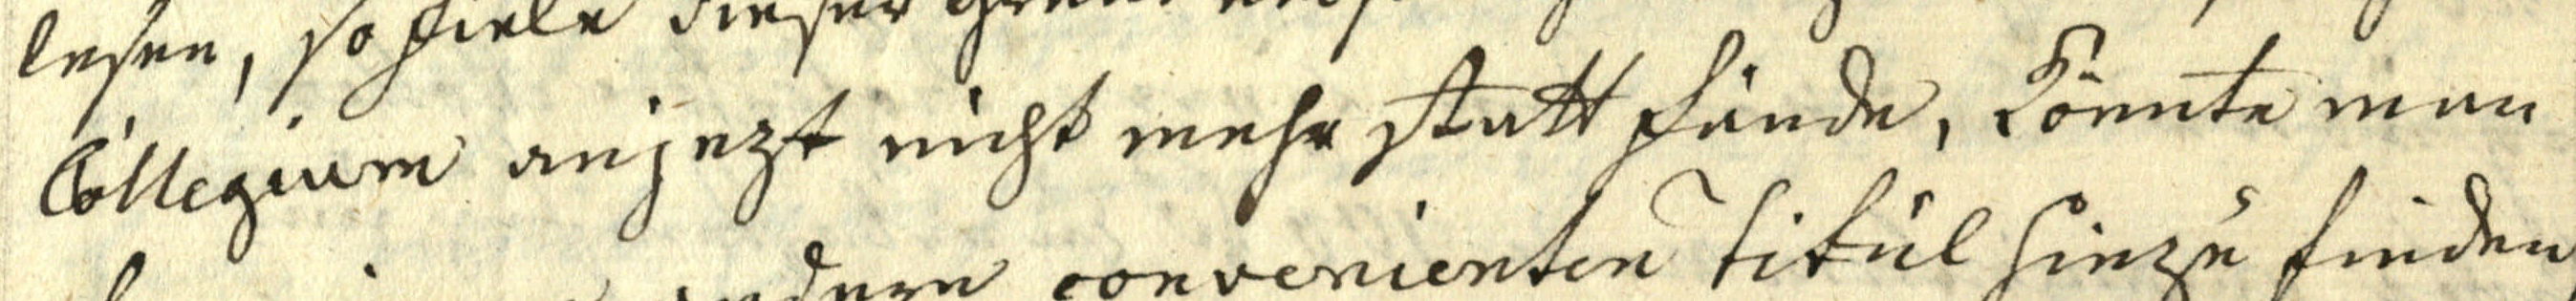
Collegium anjezt nicht mehr statt fände, könnte man
